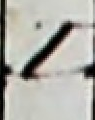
I
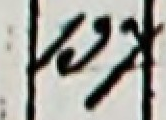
137
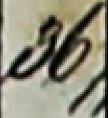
36
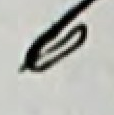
6
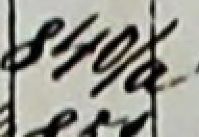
840/a
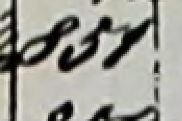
851
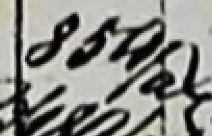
854/a
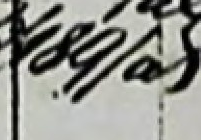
189/a
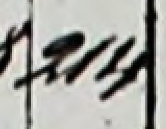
214
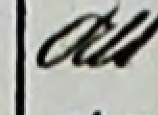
Alt
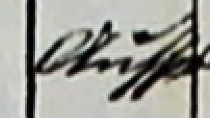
Aussee
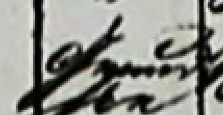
Grund„
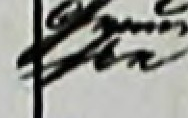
fer
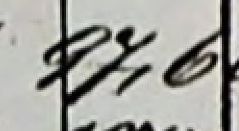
97,6
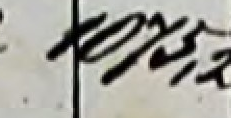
1075,2
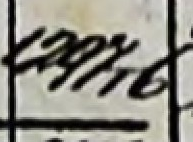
1297,6
